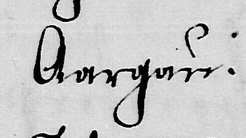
Aargau.
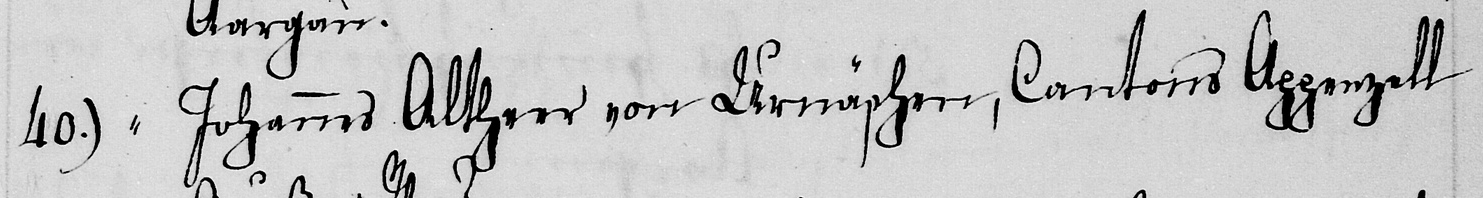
40.) “ Johannes Altheer von Urnäschen, Cantons Appenzell
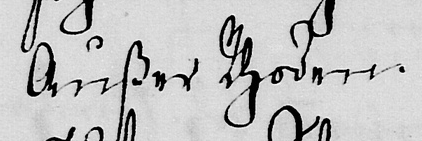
Außer Rhoden.
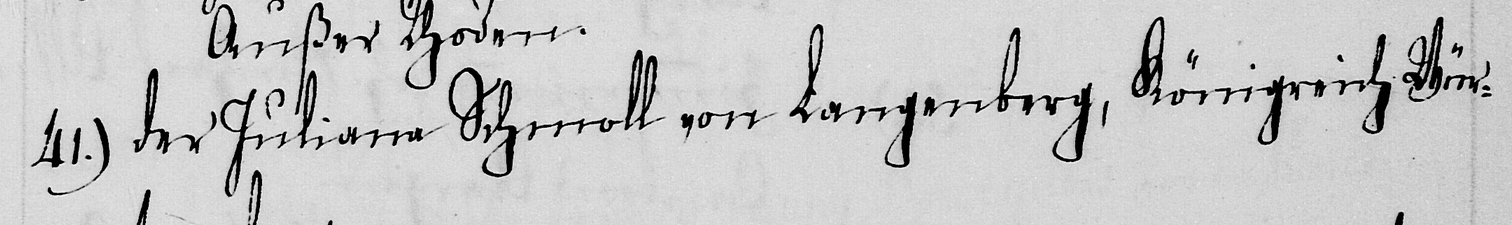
41.) der Juliana Schmoll von Langenberg, Königreich Wür¬
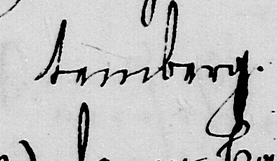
temberg.
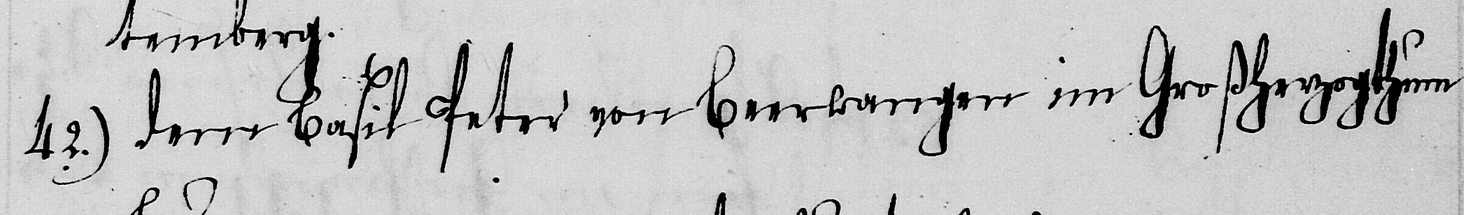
42.) dem Basil Peter von Beerwangen im Großherzogthum
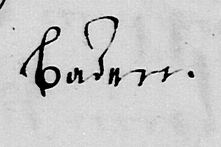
Baden.
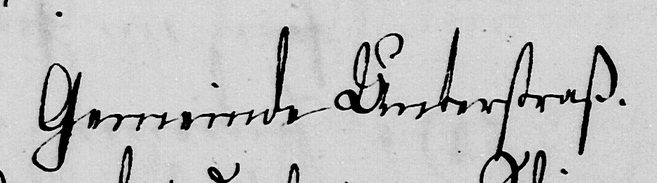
Gemeinde Unterstraß.
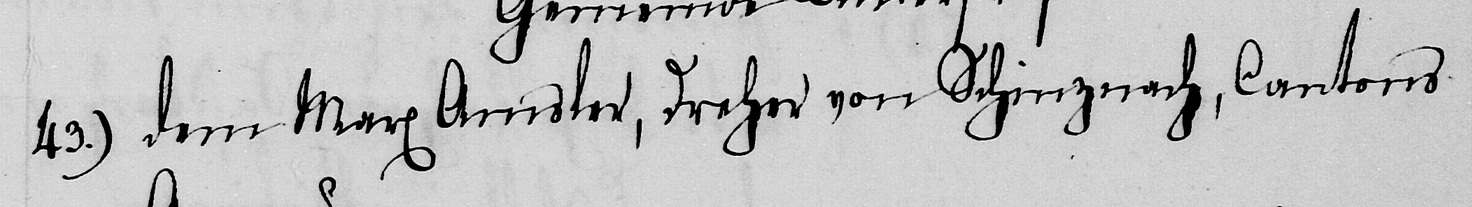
43.) dem Marx Amsler, Dreher von Schinznach, Cantons
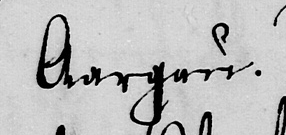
Aargau.
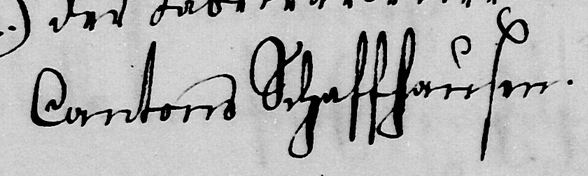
Cantons Schaffhausen.
